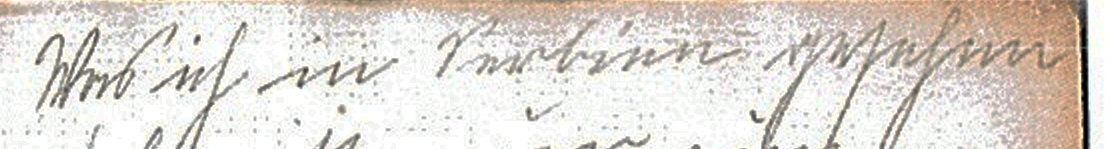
Was ich in Serbien gesehen
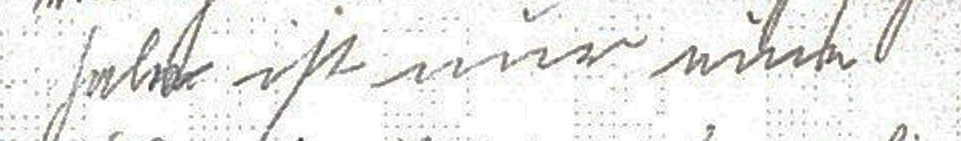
habe ist nur eine
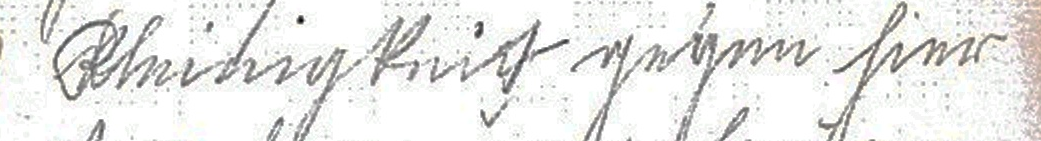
Kleinigkeit gegen hier
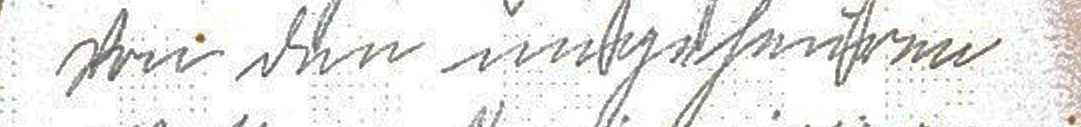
von den ungeheuren
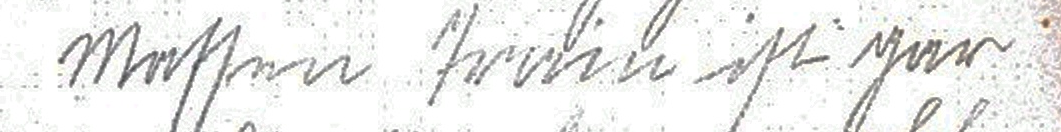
Massen Train ist gar
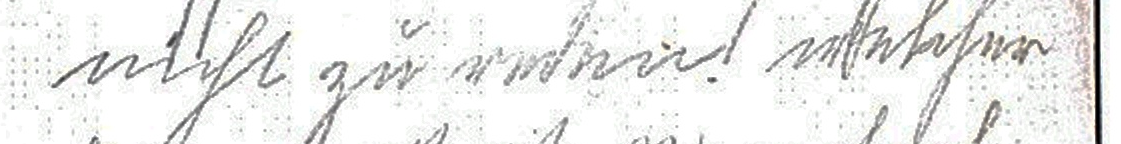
nicht zu reden welcher
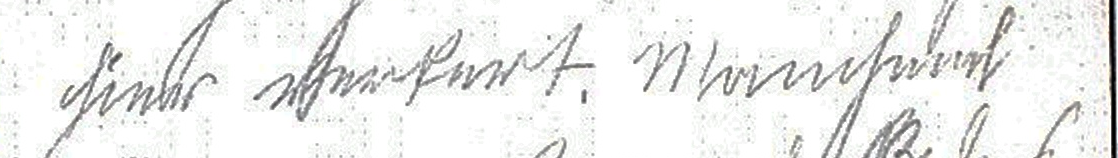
hier verkehrt. Manchmal
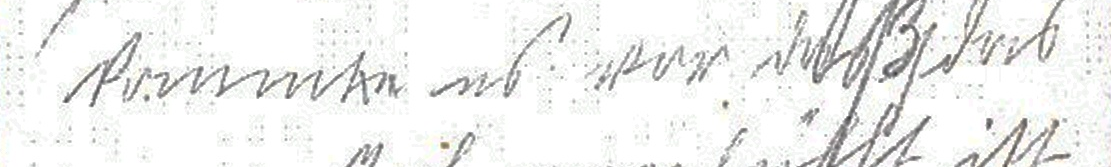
komt es vor daß das
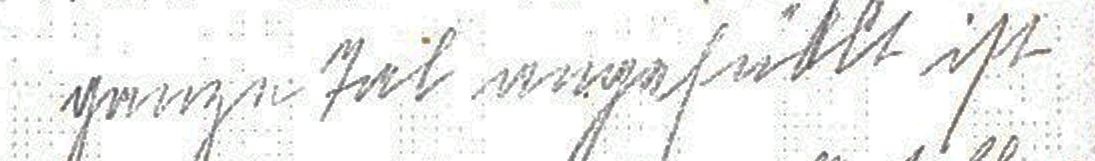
ganze Tal angefüllt ist
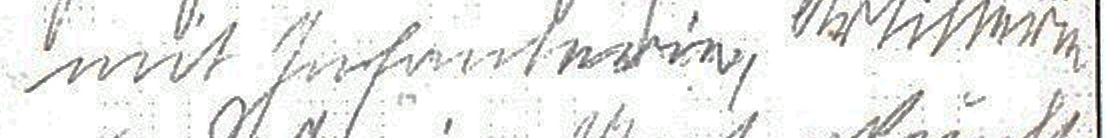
mit Infanterie, Artillerie
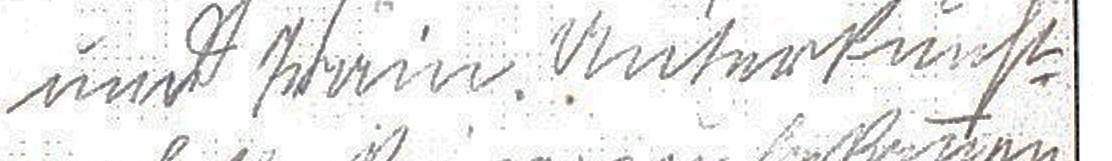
und Train. Unterkunfst
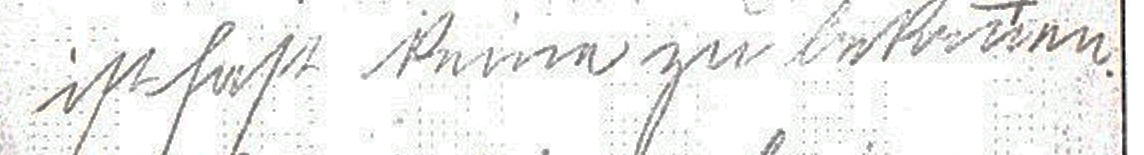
ist fast keine zu bekommen
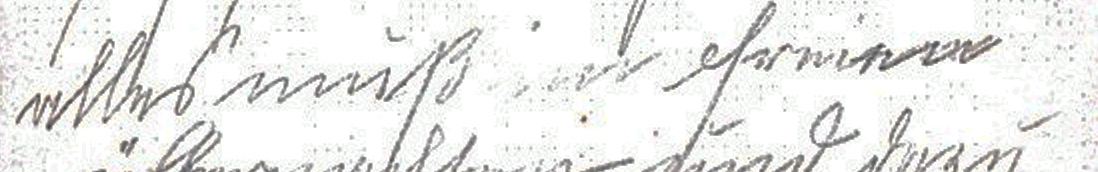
alles muß im freien
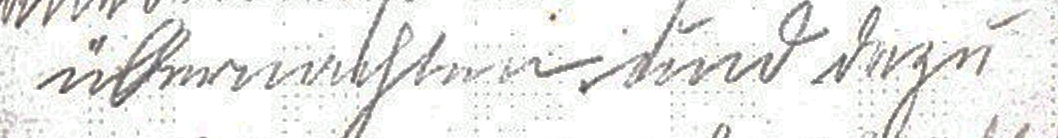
übernachten und dazu
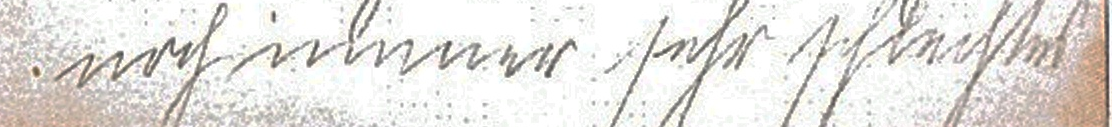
noch immer sehr schlechtes
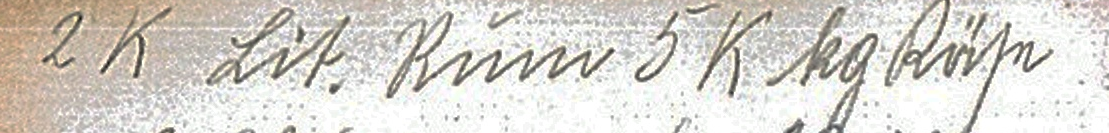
2 K Lit. Rum 5 K kg Käse
